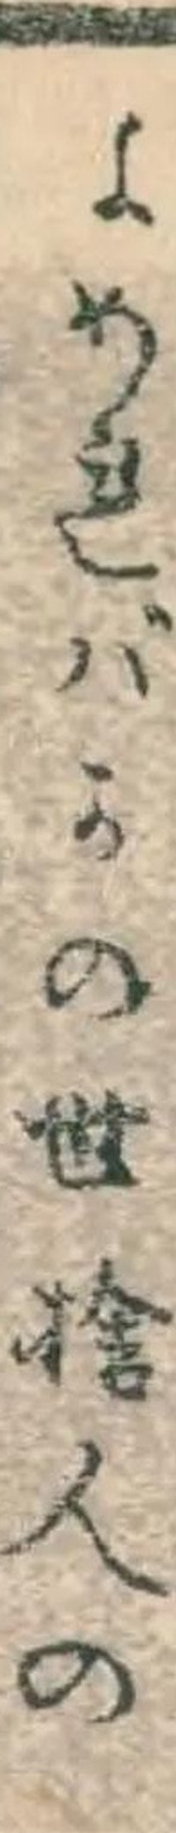よめればかの世捨人の
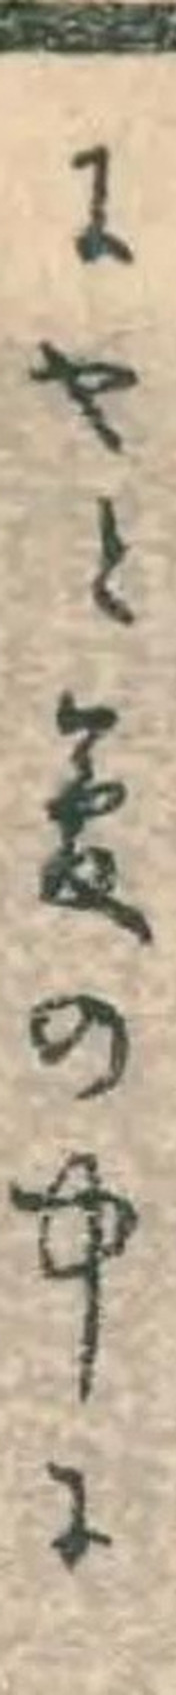にやと夢の中に
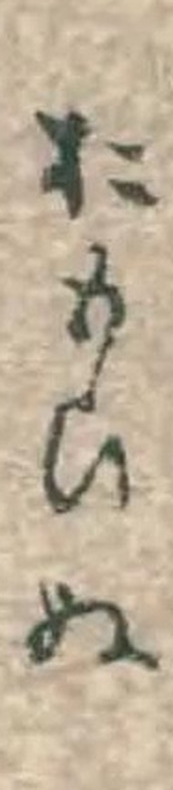おもひぬ
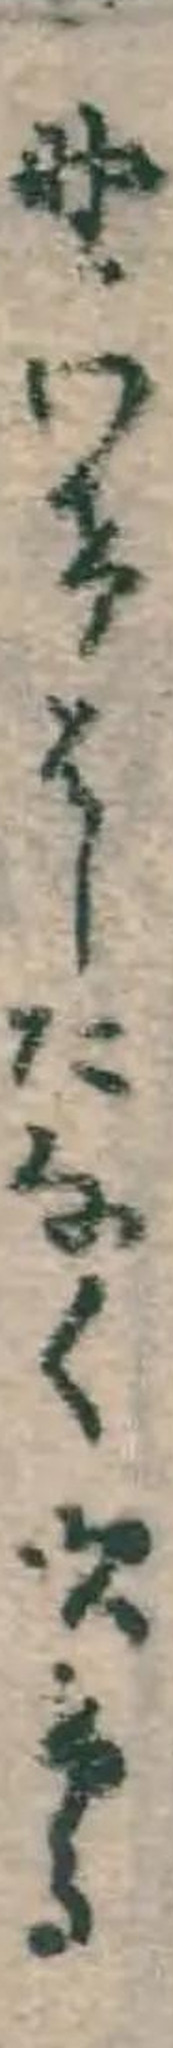野わけはしたなく吹ける
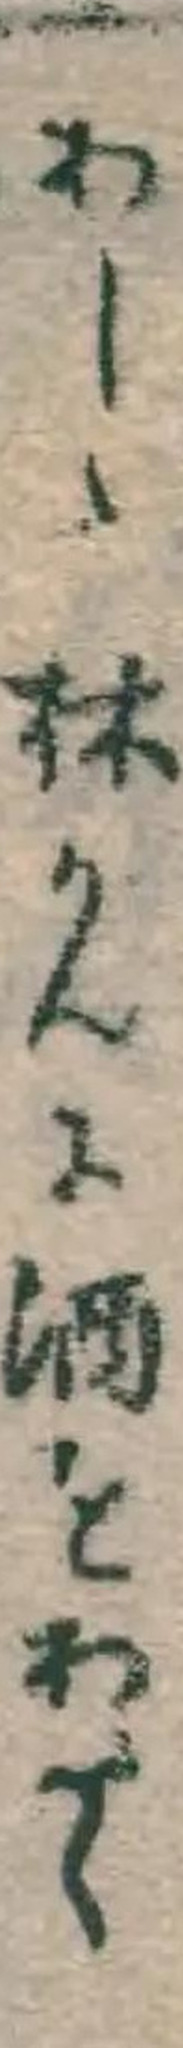あした林かんに酒をあたゝ
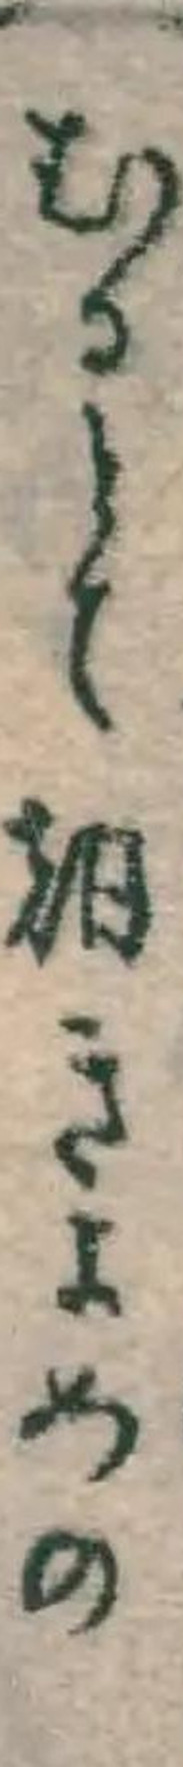むるとて朝きよめの
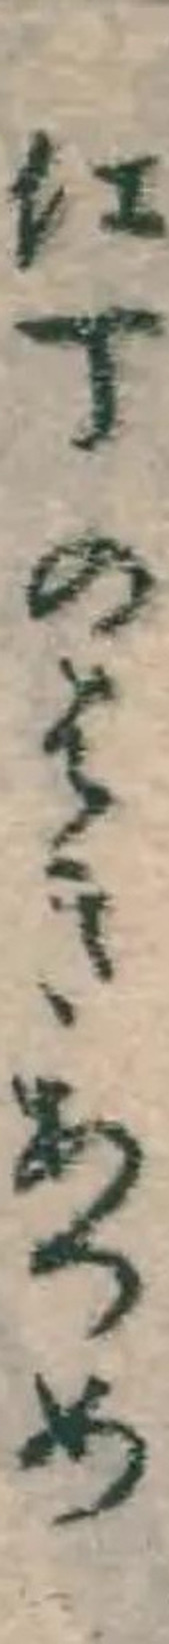仕丁のはきあつめ
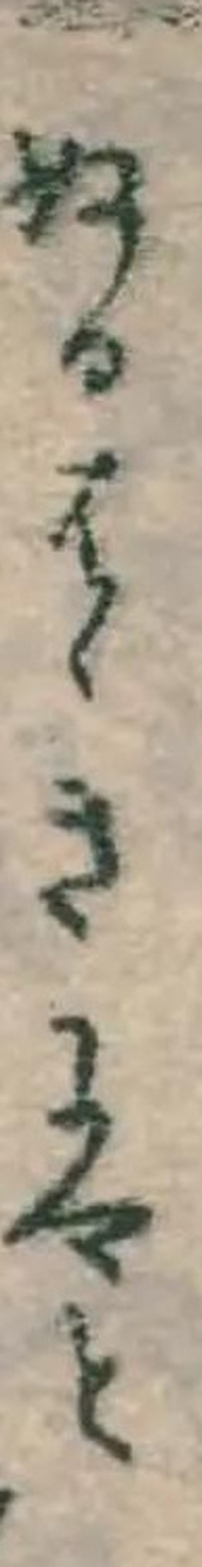ぬるはゝきにやと
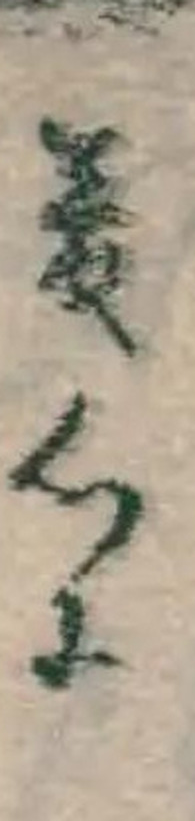夢心に
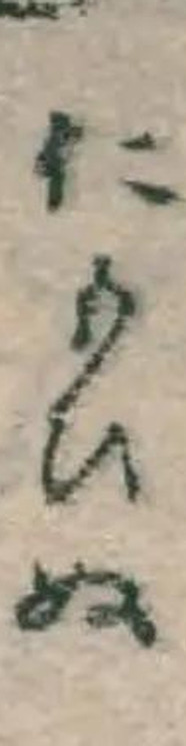おもひぬ
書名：百鬼徒然袋 3巻. [2]
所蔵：国立国会図書館 National Diet Library, JAPAN
